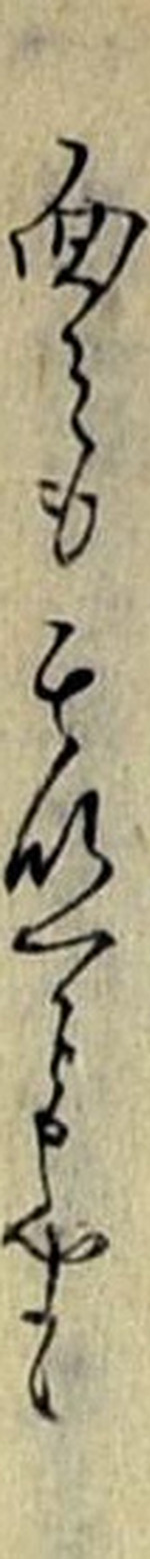面々も其段可被申聞候
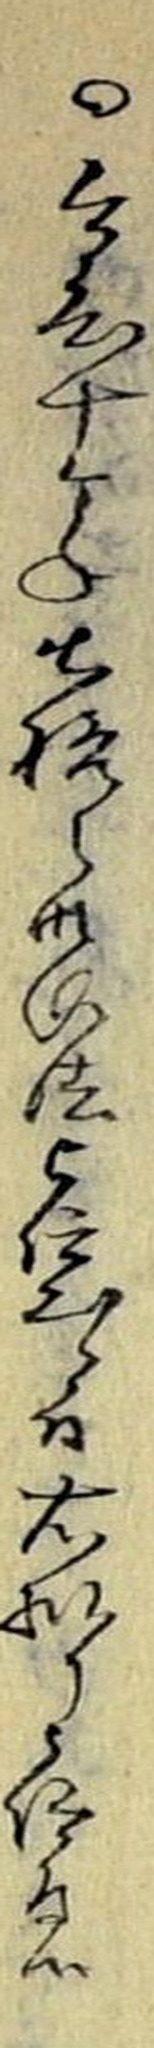○今度十ヶ年出格之御趣法被仰出候に付右掛り被仰付候
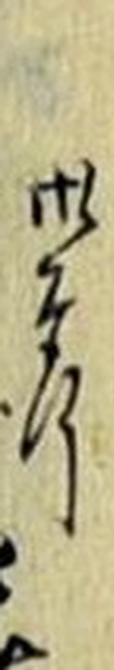御奉行
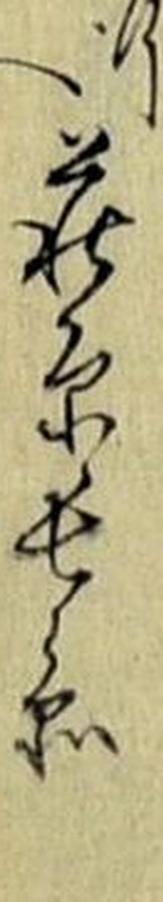萩原長兵衛
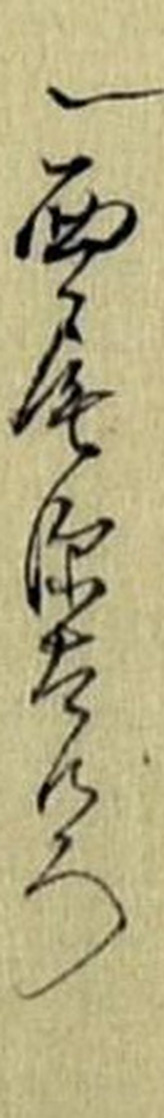西尾源太左衛門
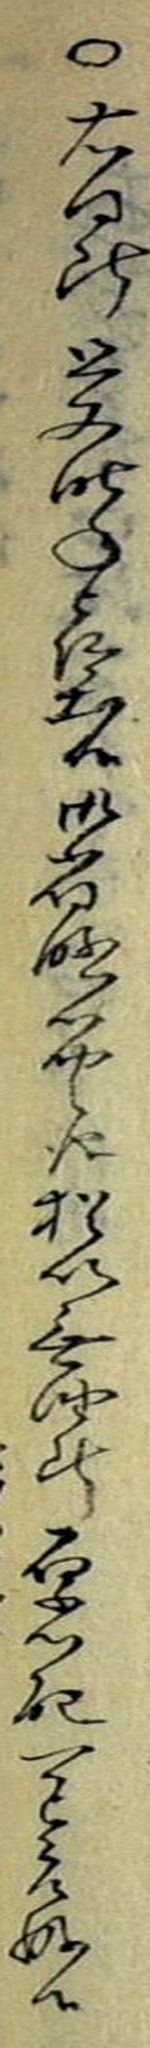○右同断且又昨年被仰出候御省略筋之儀猶以無由断厚心配可被取扱候
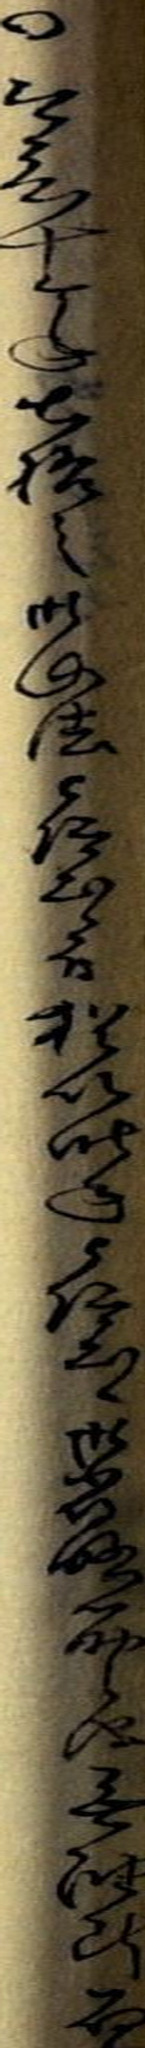○今度十ヶ年出格之御趣法被仰出候に付猶以昨年被仰出候御省略筋之儀無由断厚心
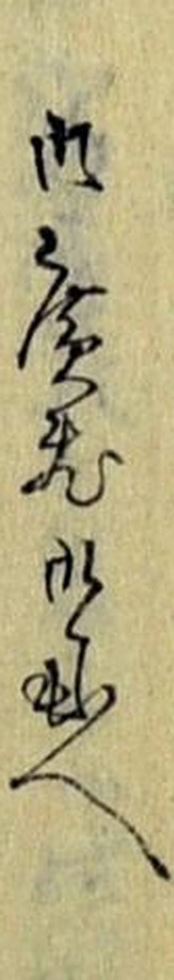御広敷御用人
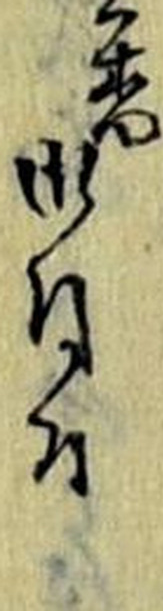御目付
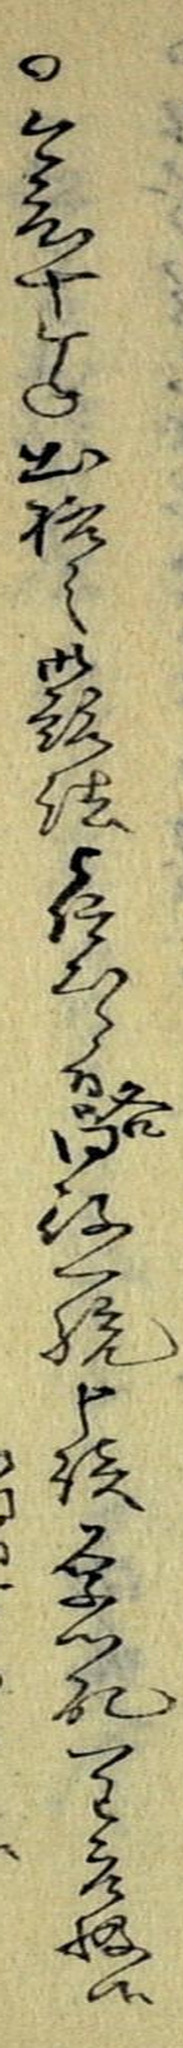○今度十ヶ年出格之御趣法被仰出候に付各同役一統申談厚心配可被取扱候
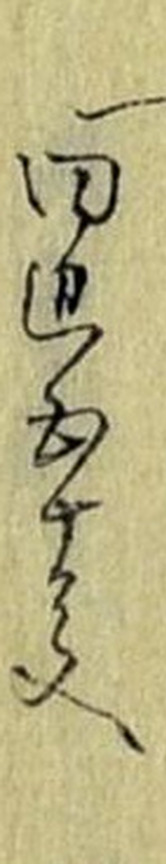田辺五太夫
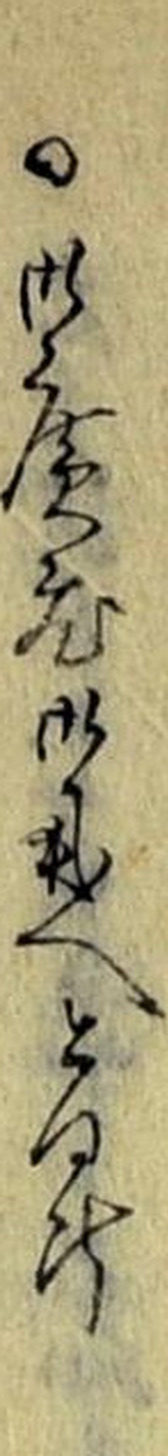○御広敷御用人と同断
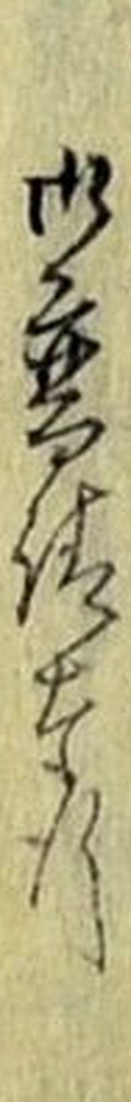御普請奉行
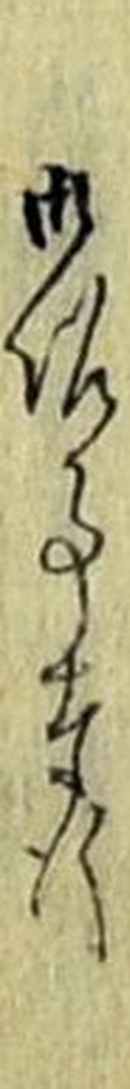御作事奉行
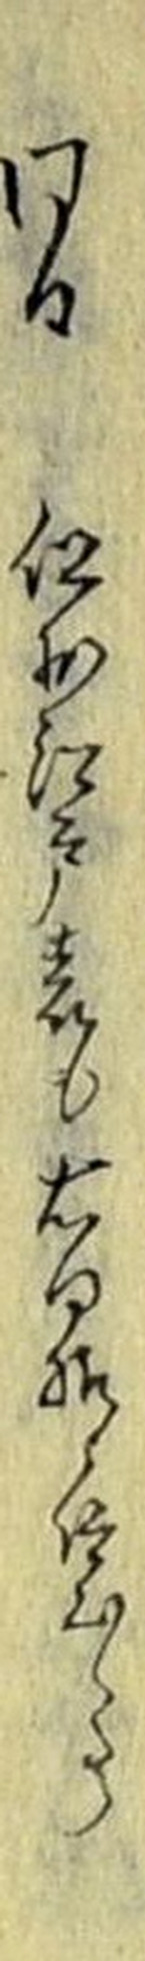同日但於江戸表も右同様被仰出候事
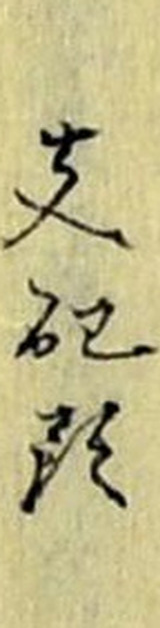支配頭
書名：命令之部 六
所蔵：福井県文書館 Fukui Prefectural Archives
